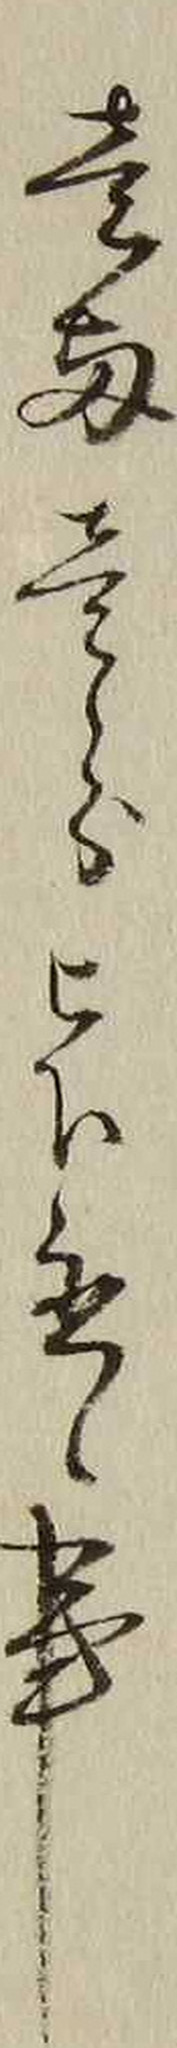壱両壱分被下置候事
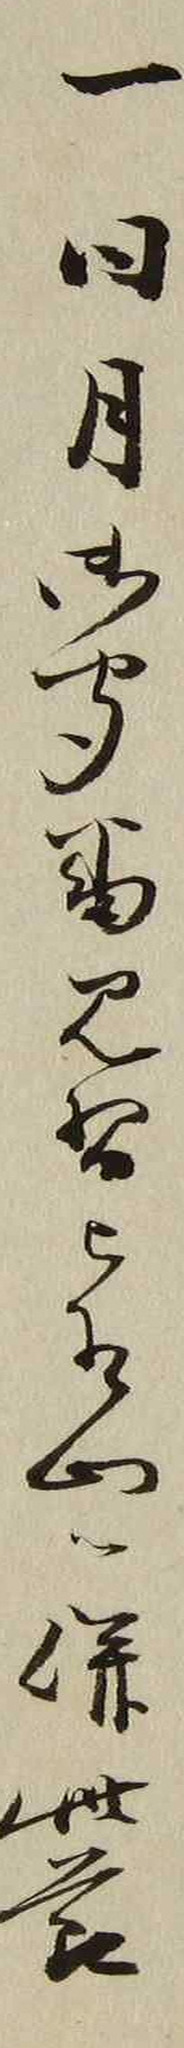一同月御聞番見習被相止候併此節
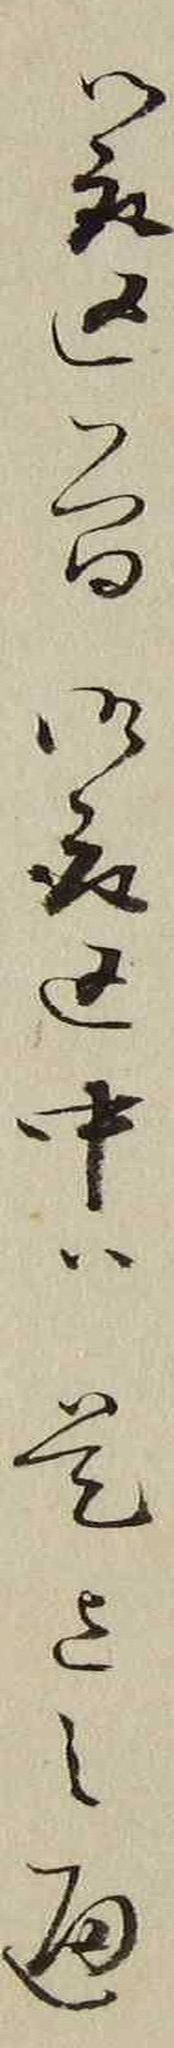御取込候間御取込中は是迄之通
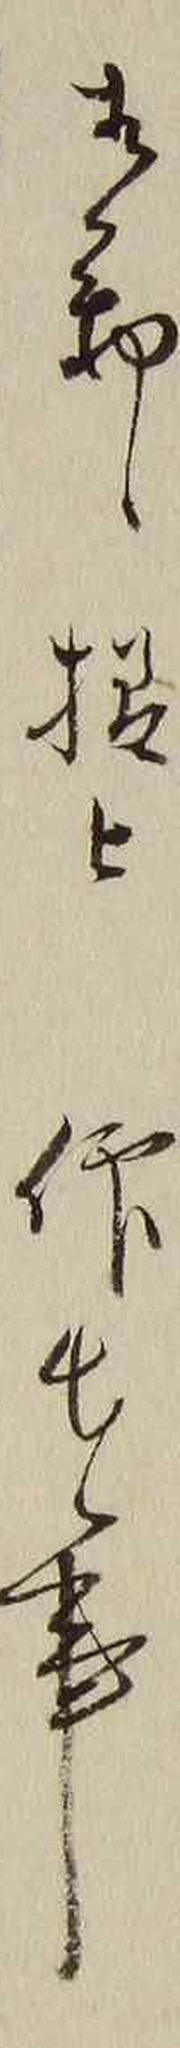相勤候様被仰出候事
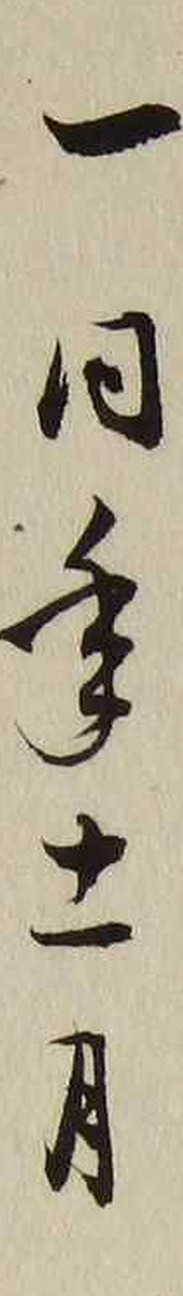一同年十一月
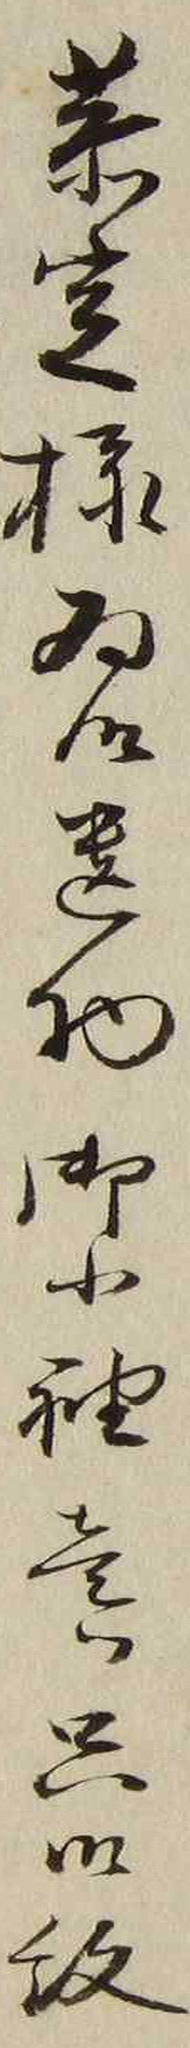恭定様為御遺物御小袖壱つ黒御紋
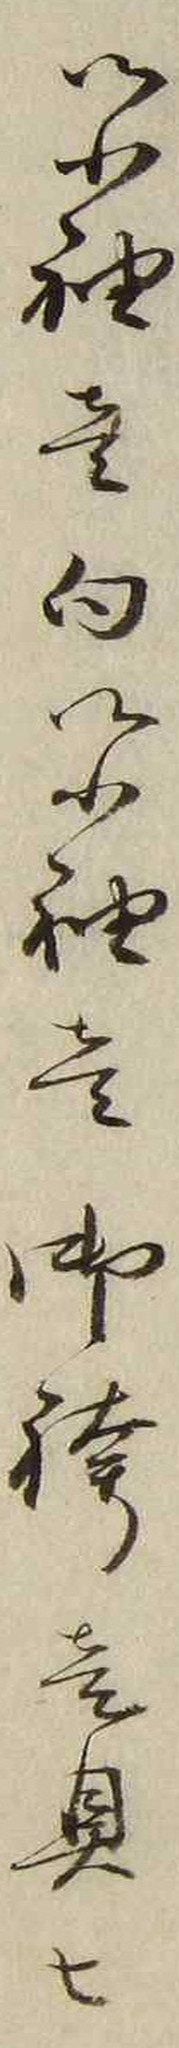御小袖壱白御小袖壱御袴壱具被

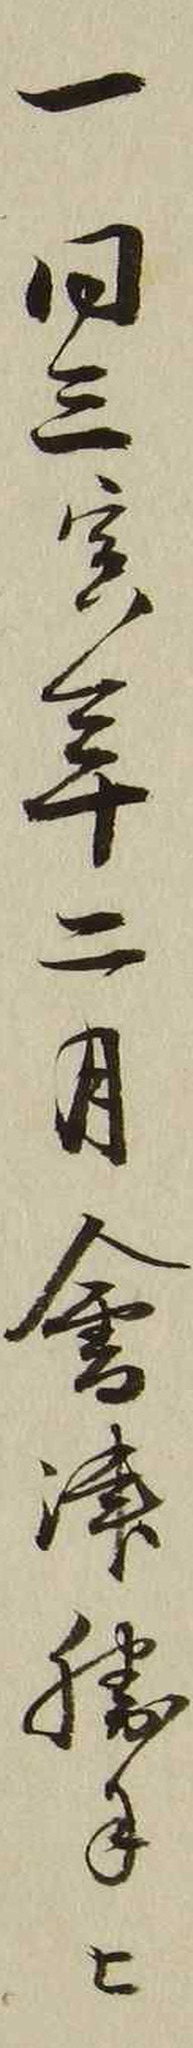一同三寅年二月会津勝手被
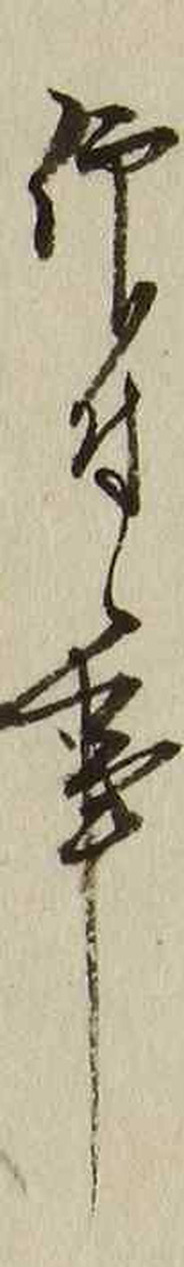仰付候事
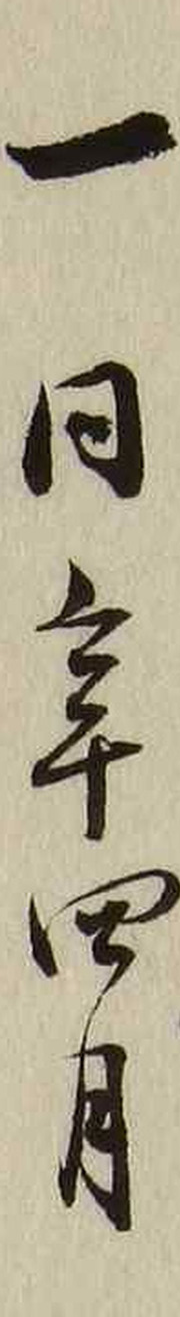一同年四月
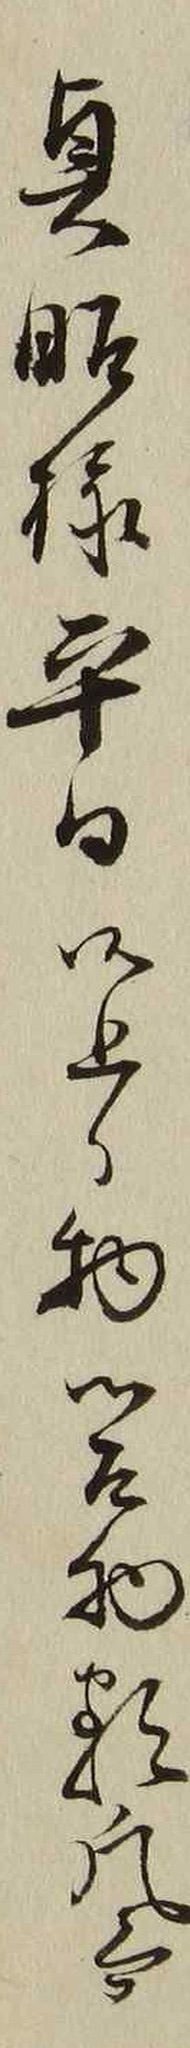貞昭様平日御上り物御召物類凡而
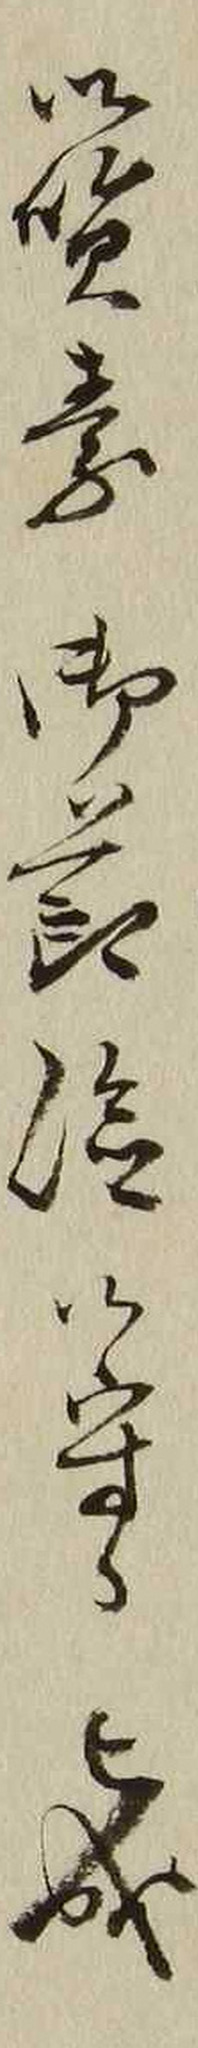御質素御節倹御守り被成
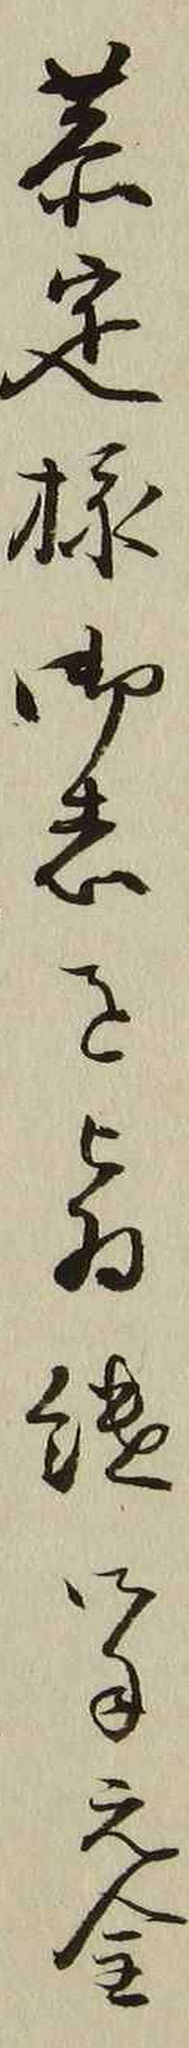恭定様御志を被為継御手元金
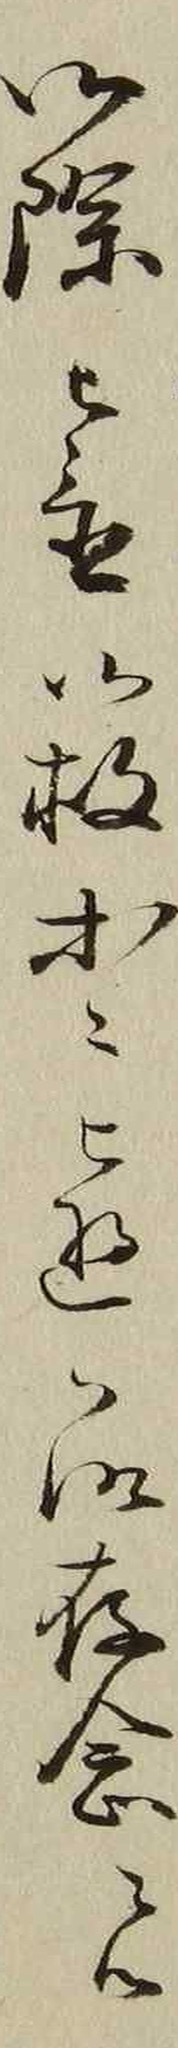御除被置御救等に被遊候御存念に候
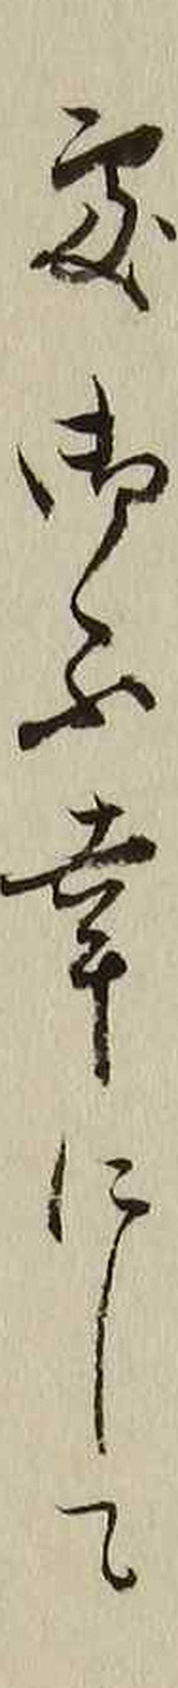処御不幸にして
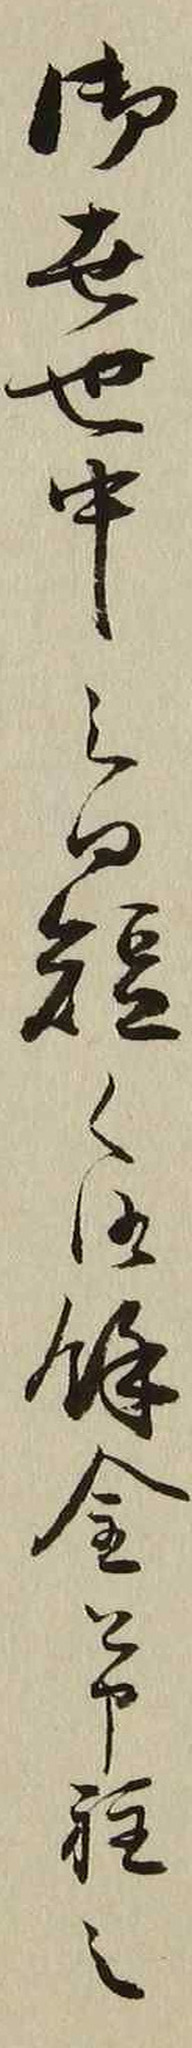御世世中之内短く御餘金と申程之
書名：諸士系譜　巻之292　き之部1
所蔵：会津若松市立会津図書館
